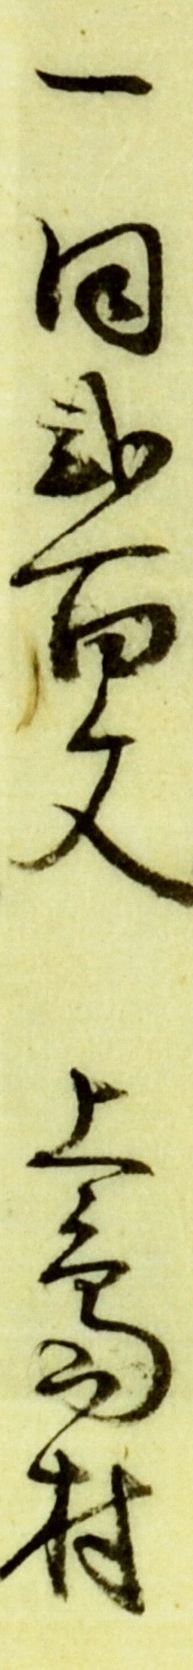一同弐百文上島村
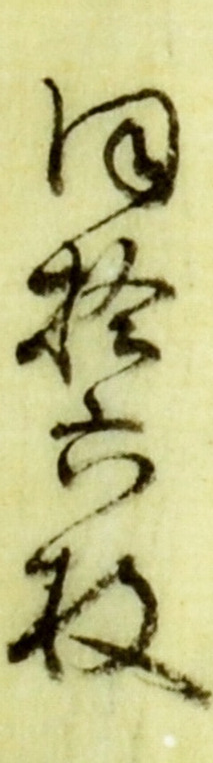同拾六枚
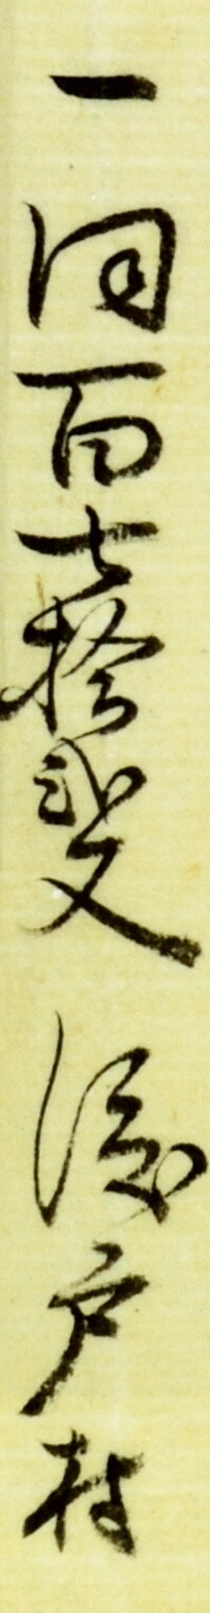一同八百七拾弐文沢底村
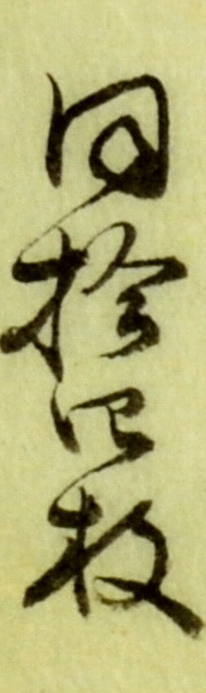同拾弐枚

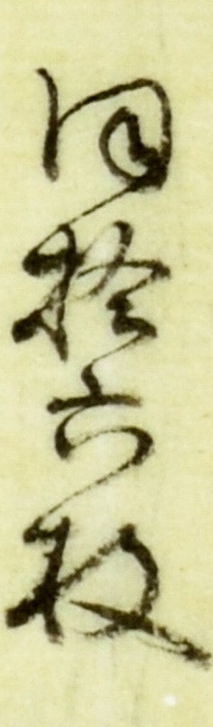同拾四枚
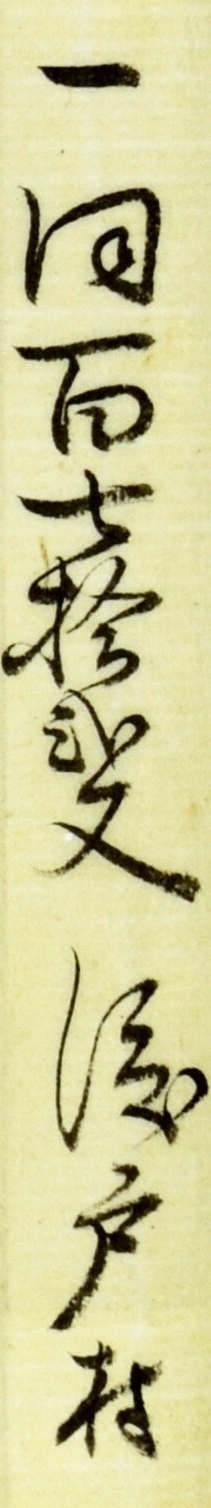一同百七拾弐文渡戸村
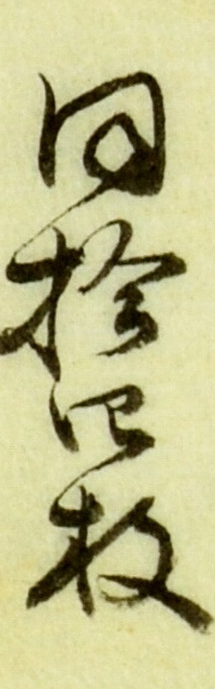同拾四枚
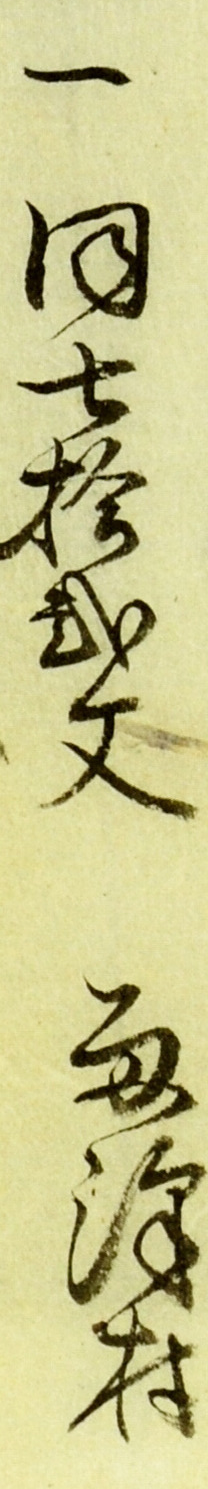一同七拾弐文雨沢村
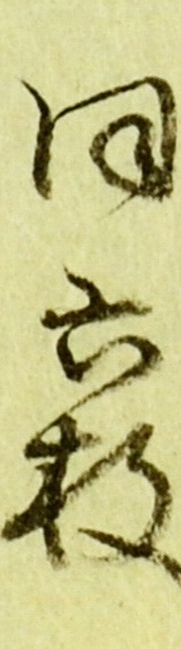同六枚
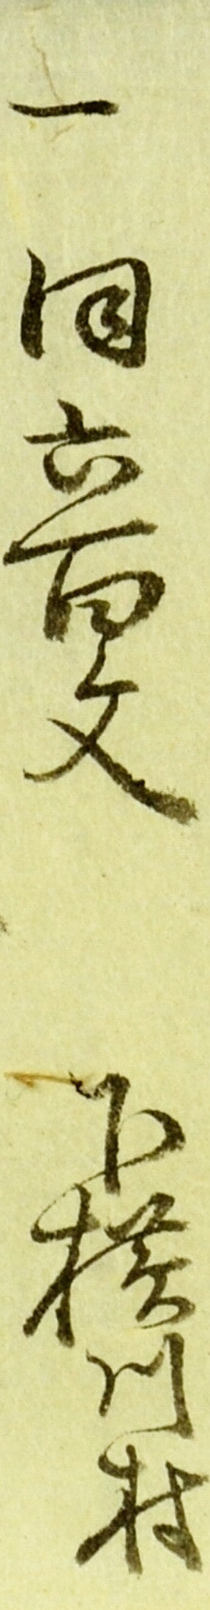一同六百文下横川村
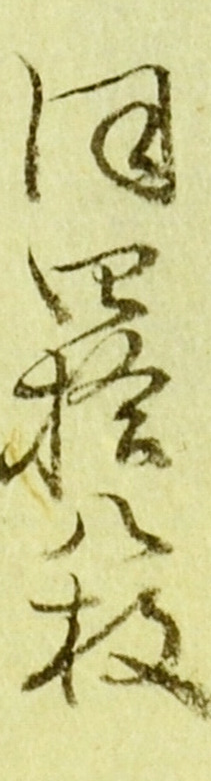同四拾八枚
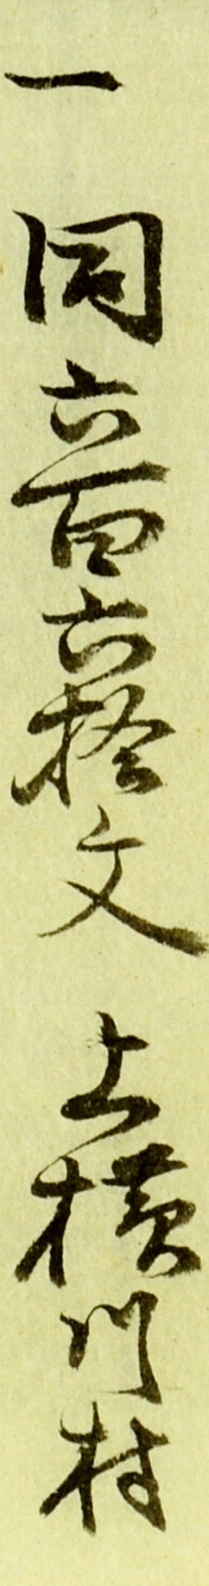一同六百六拾文上横川村
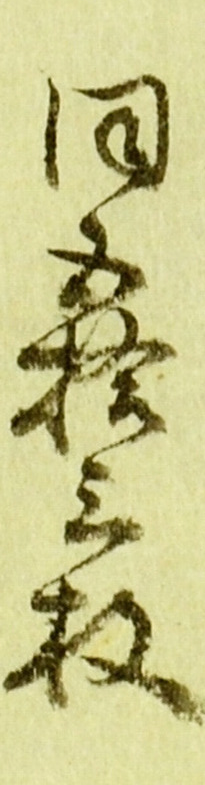同五拾三枚
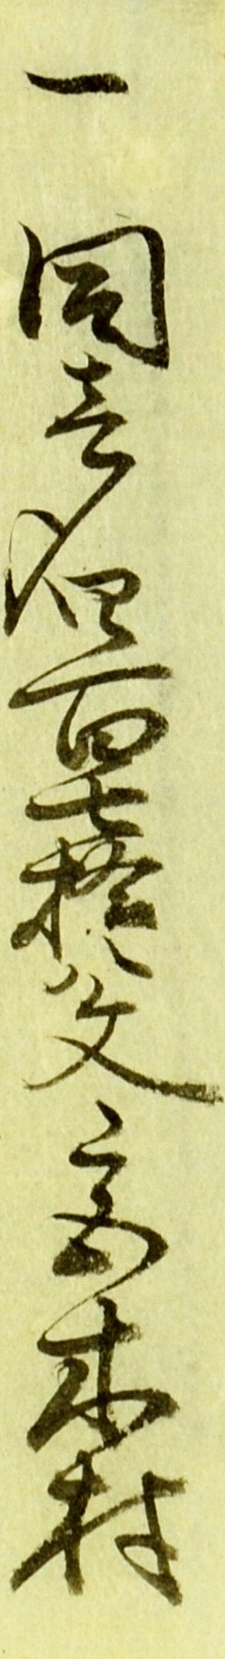一同壱貫四百七拾八文宮木村
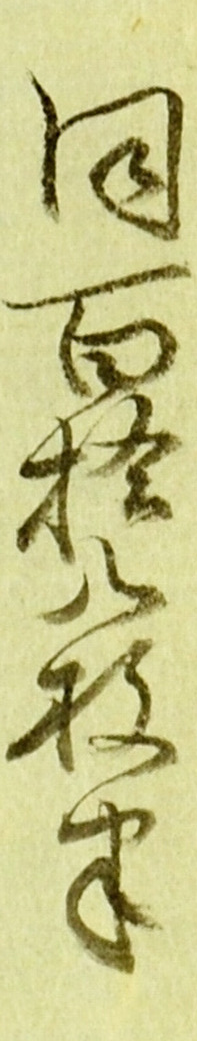同百拾八枚半
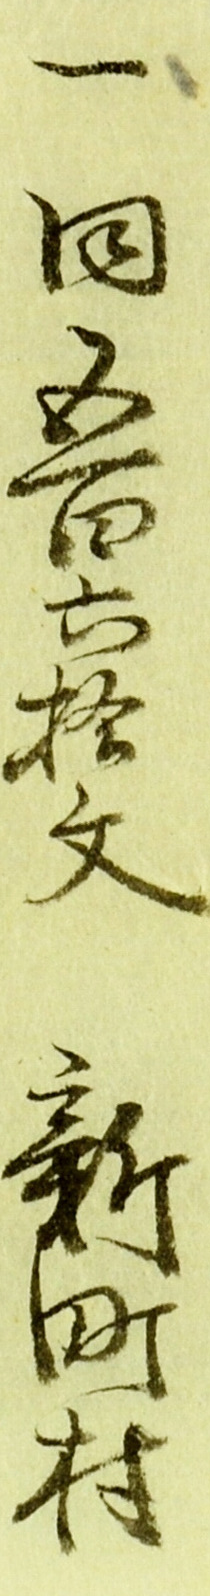一同五百六拾文新町村
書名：上伊那郷諸運上取調帳
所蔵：伊那市立高遠町図書館・合同会社AMANE
